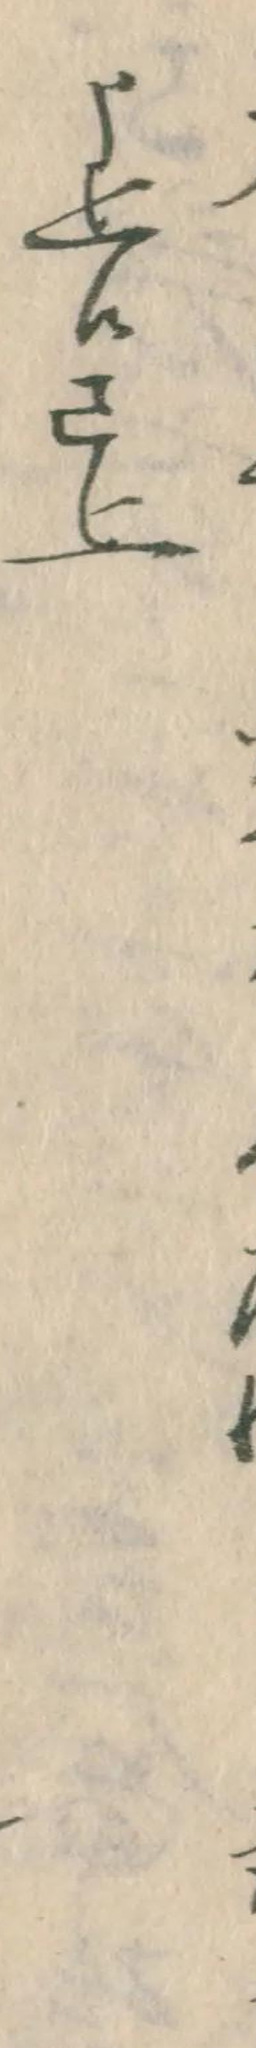申上候已上
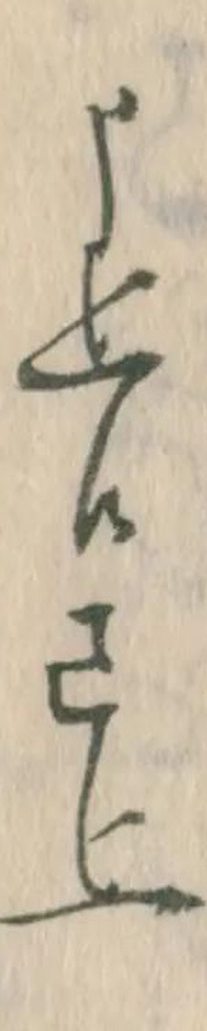申上候已上
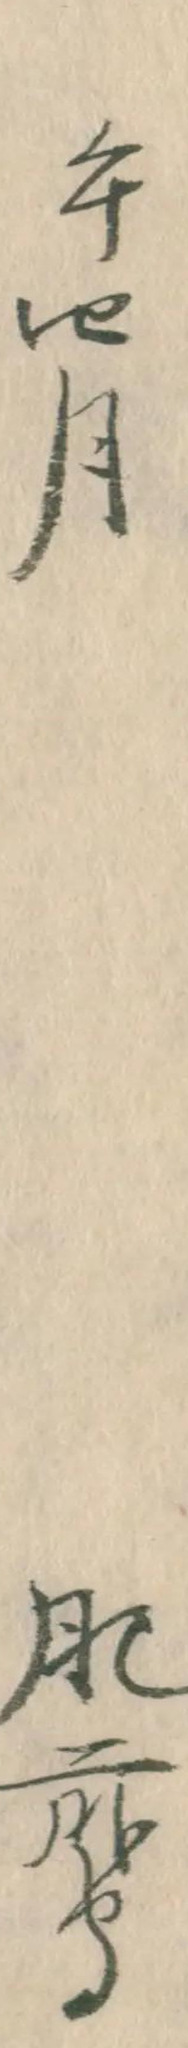午四月肥前守
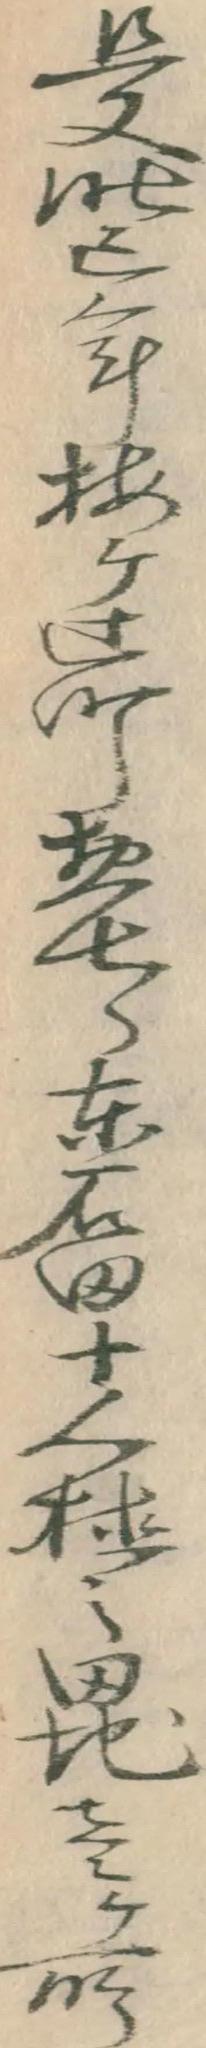且又昨巳年梅ヶ辻町惣七へ東石田十人植之田地壱ケ所

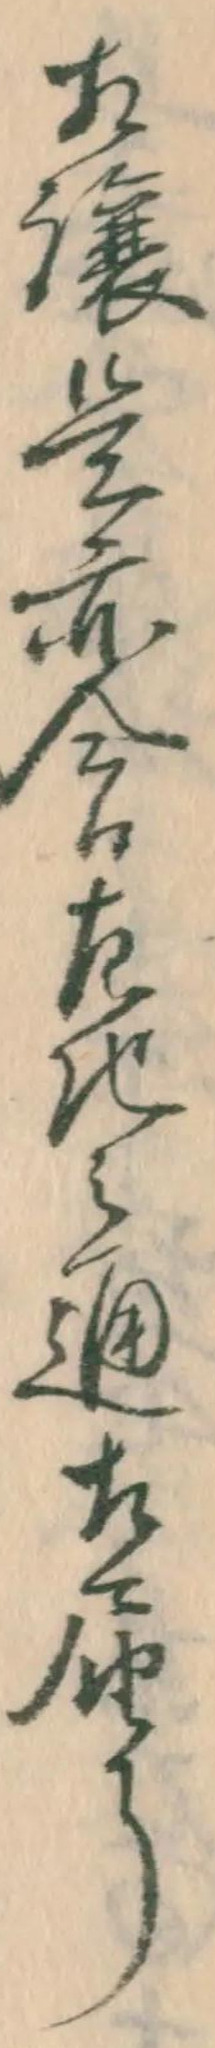相譲是亦今日左地之通相届了
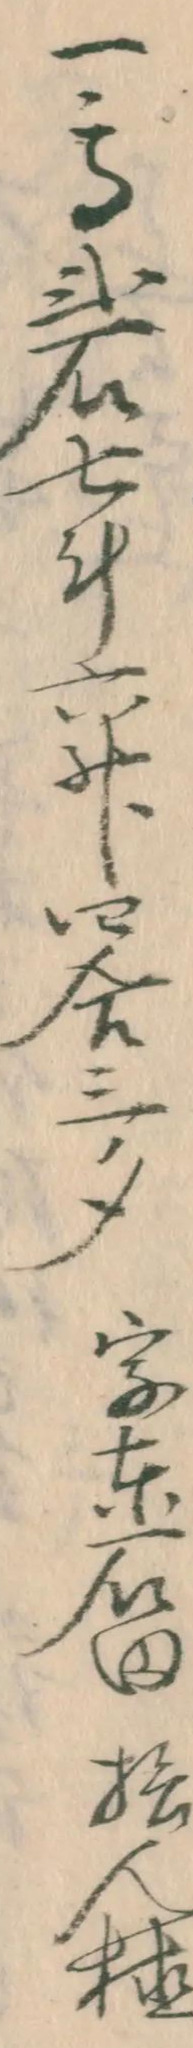一高弐石七斗六升四合三夕字東石田拾人植
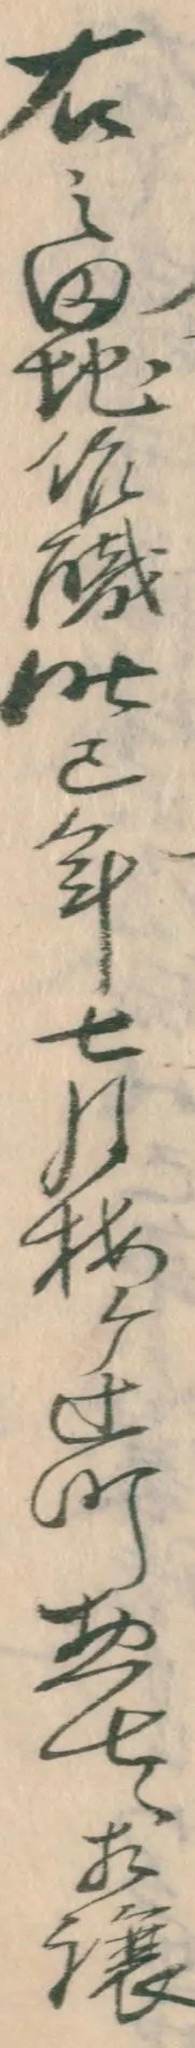右之田地作職昨巳年七月梅ヶ辻町惣七へ相譲
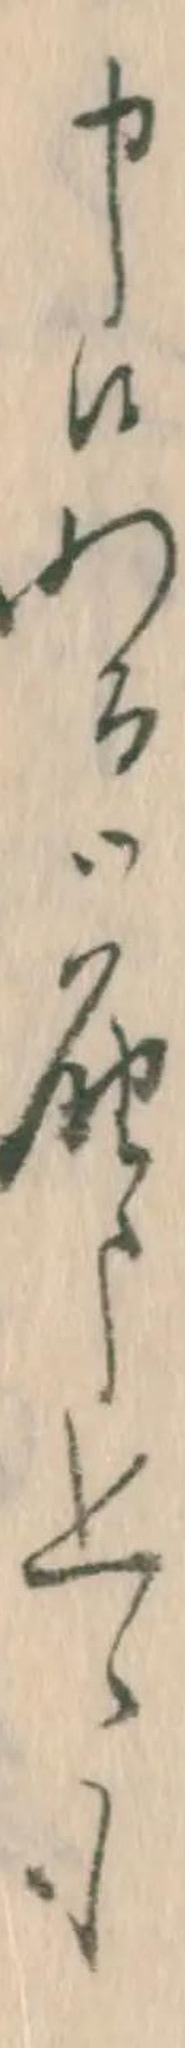申候仍而御届申上候以上
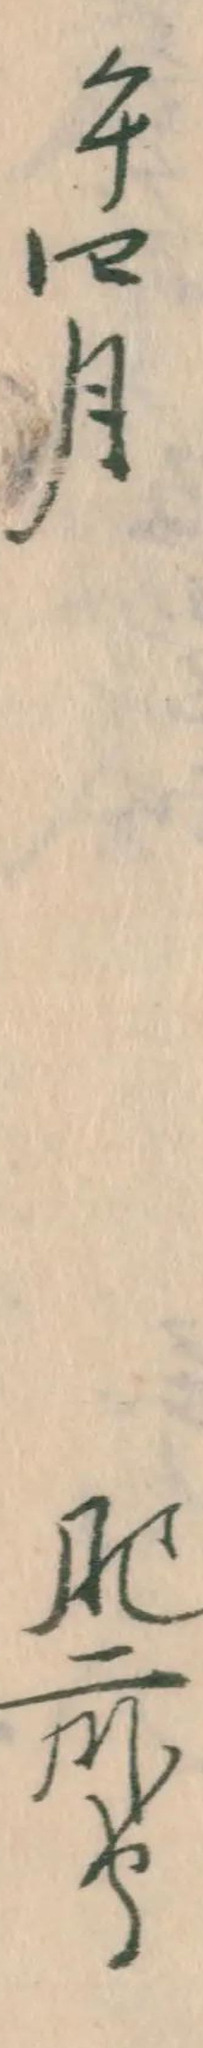午四月肥前守
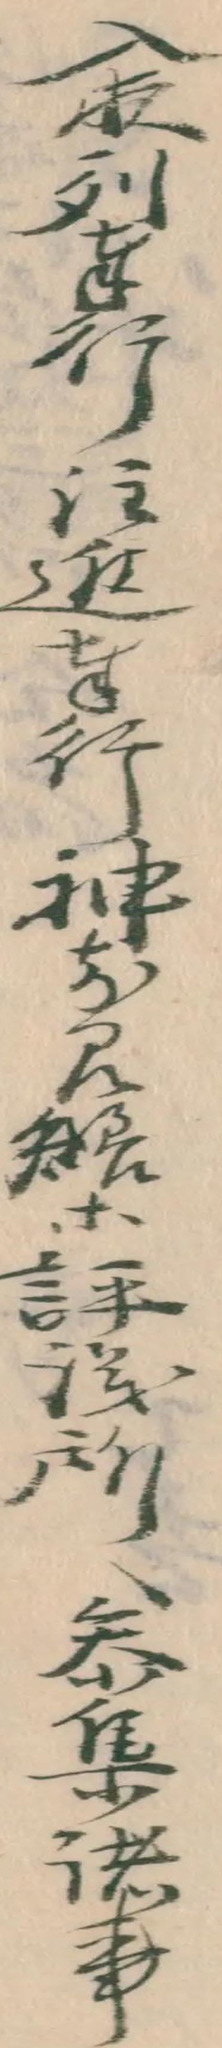入夜列奉行注進奉行神前見繕等評議所へ参集諸事
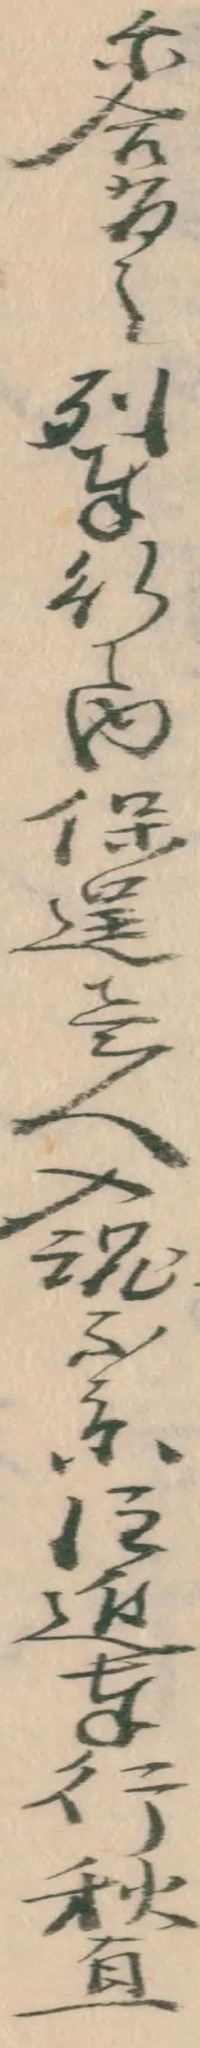に合有也列奉行之内保逞壱人入魂不参注進奉行秋直
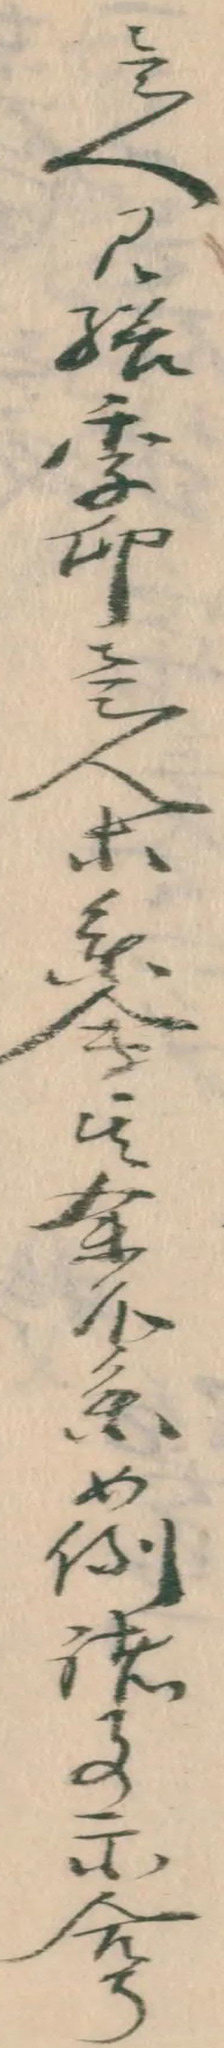壱人見繕季卯壱人等参會其余外参如例諸事示合了
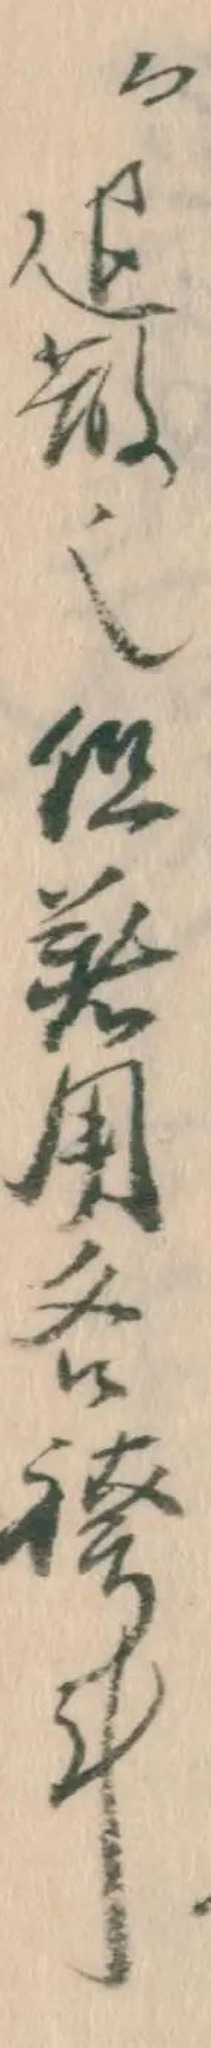而退散也但着用各袴斗
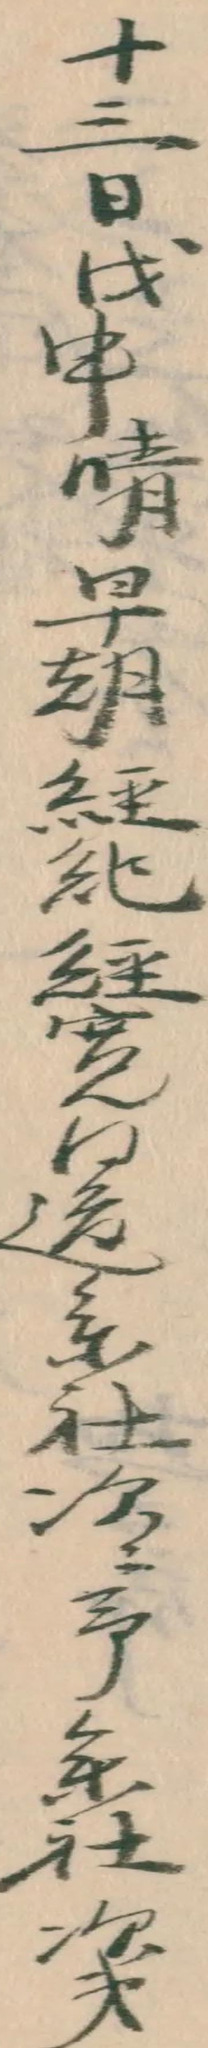十三日戊申晴早朝経紀経寛同道参社次ニ予参社次第
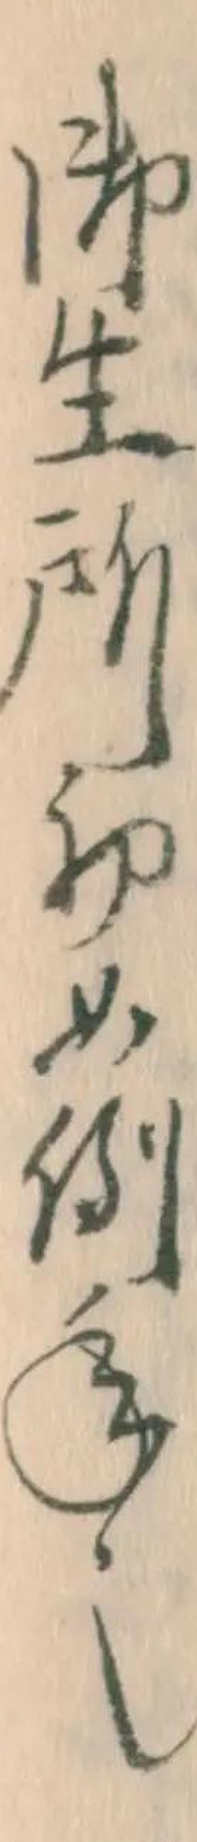御生所初如例年也
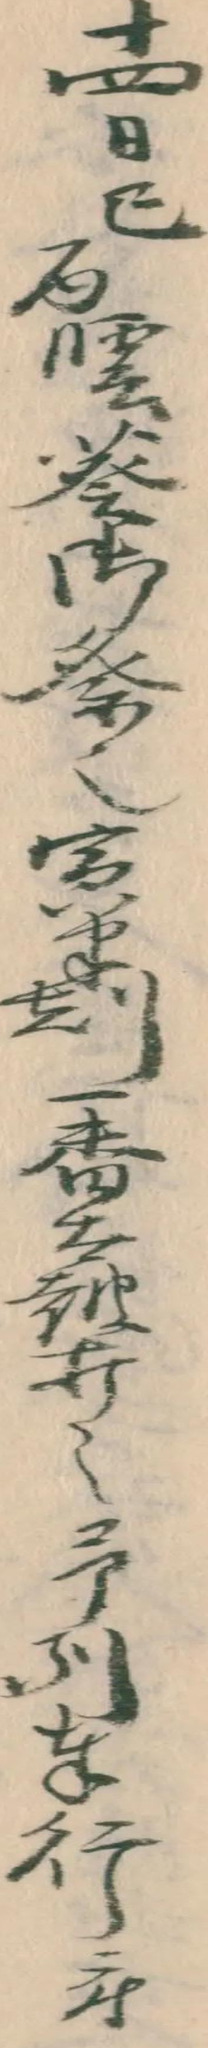十四日己酉曇葵御祭也寅半刻一番太皷打也予列奉行ニ付
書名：賀茂社記録. 第66冊
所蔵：国立国会図書館 National Diet Library, JAPAN
